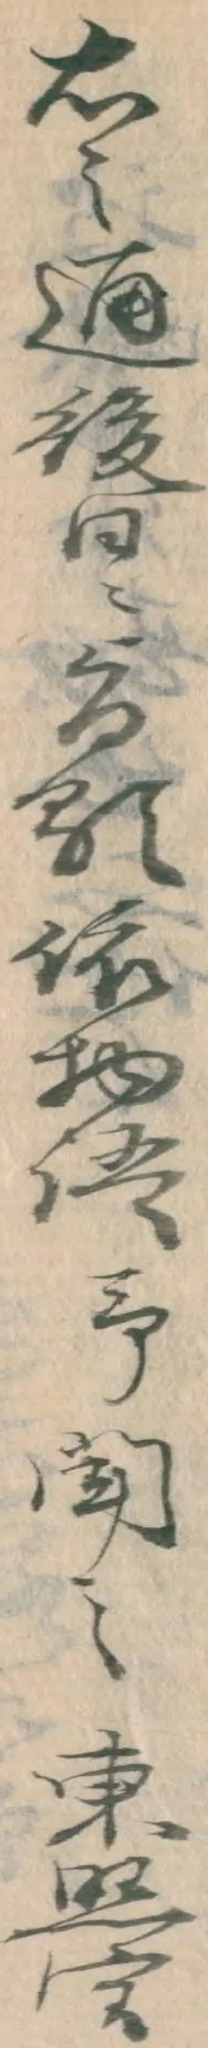右之通後日々旨顕依物語予聞之東照宮
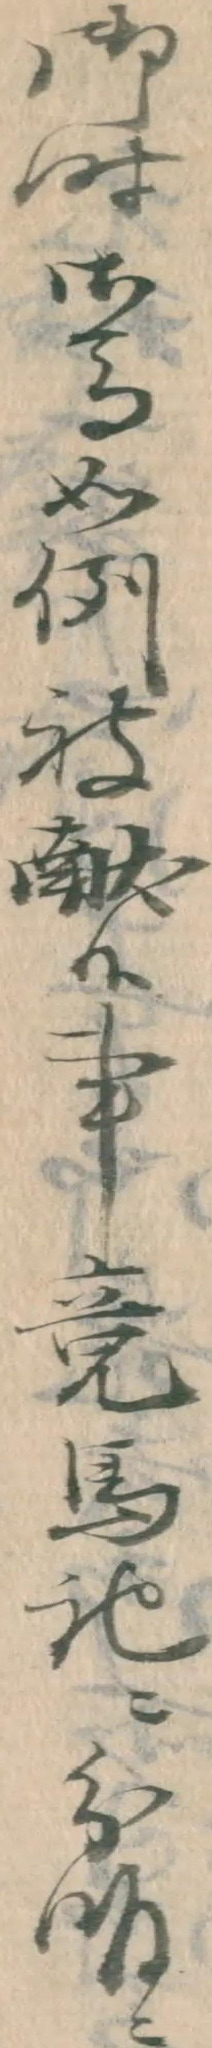御時御馬如例被献候事競馬記ニ分明ニ
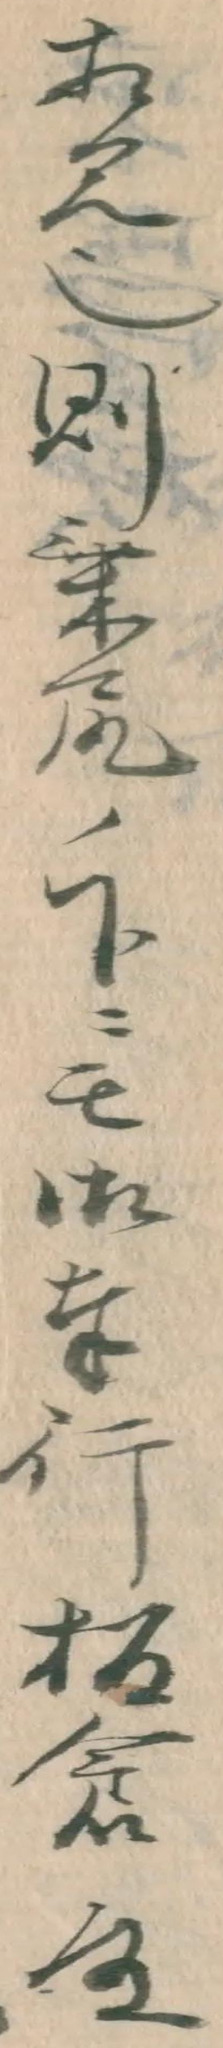相見也則乗尻ノ下ニ其御奉行板倉殿
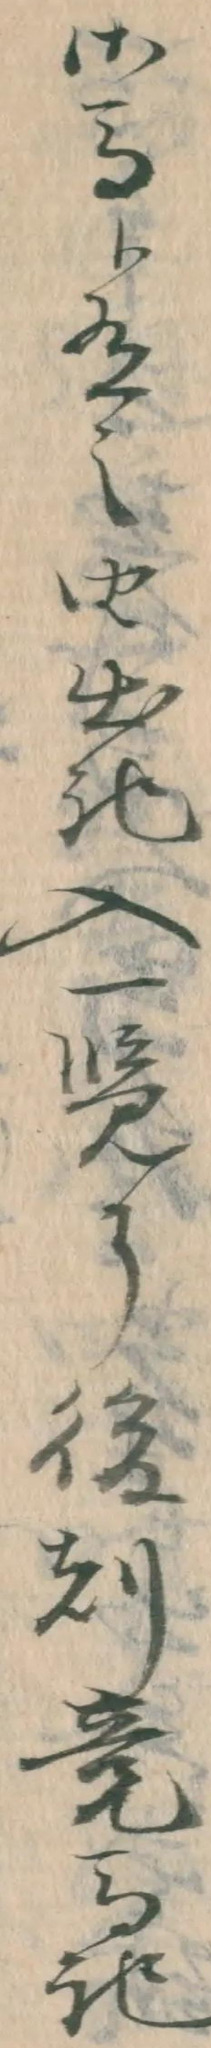御馬ト有之由書出記入一覧に後刻競馬記
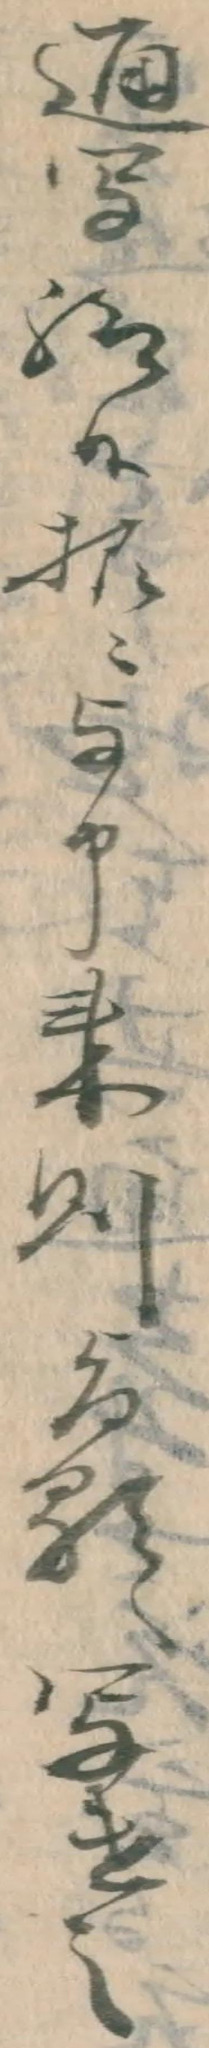通写給候様々与申来則旨顕へ写遣之
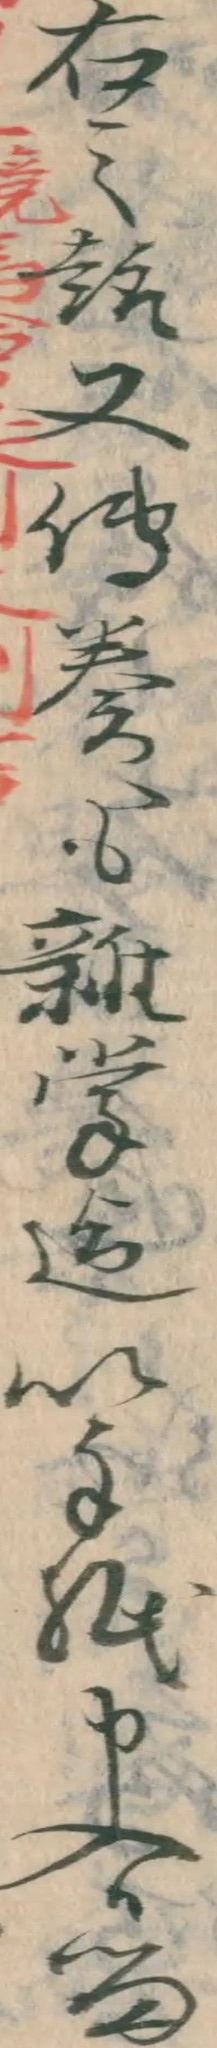右之趣又伝奏へも雑掌迄以手紙申入候留
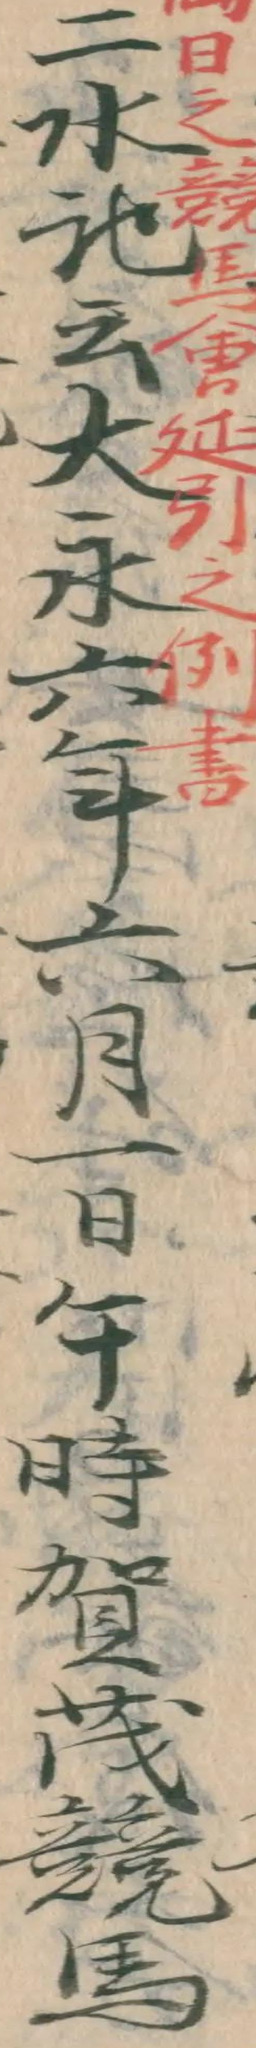二水記云大永六年六月一日午時賀茂競馬
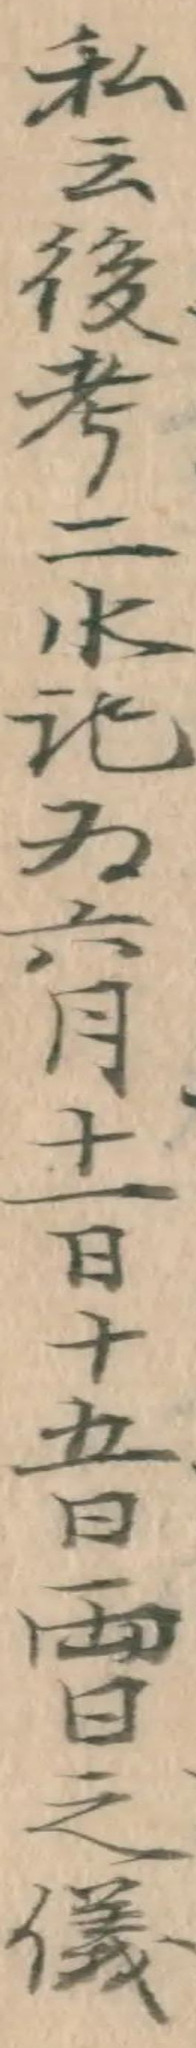私云後考二水記為六月十一日十五日両日之儀
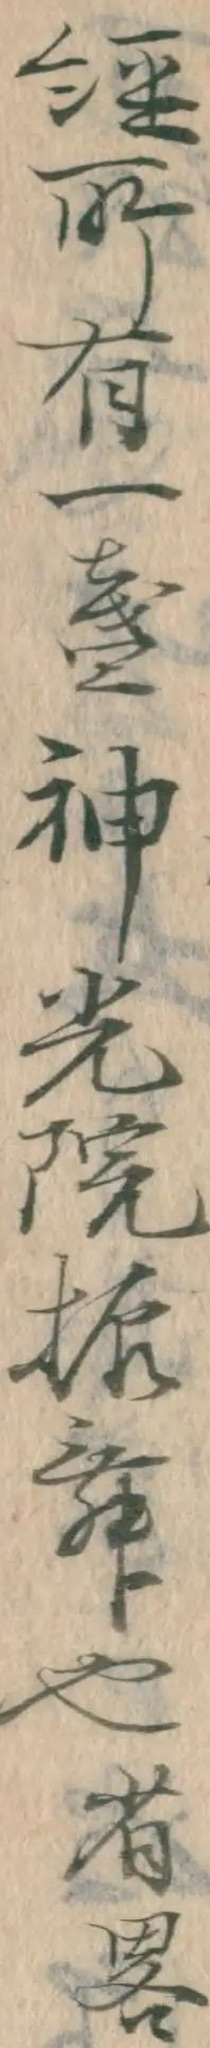経所有一盞神光院振舞也省略
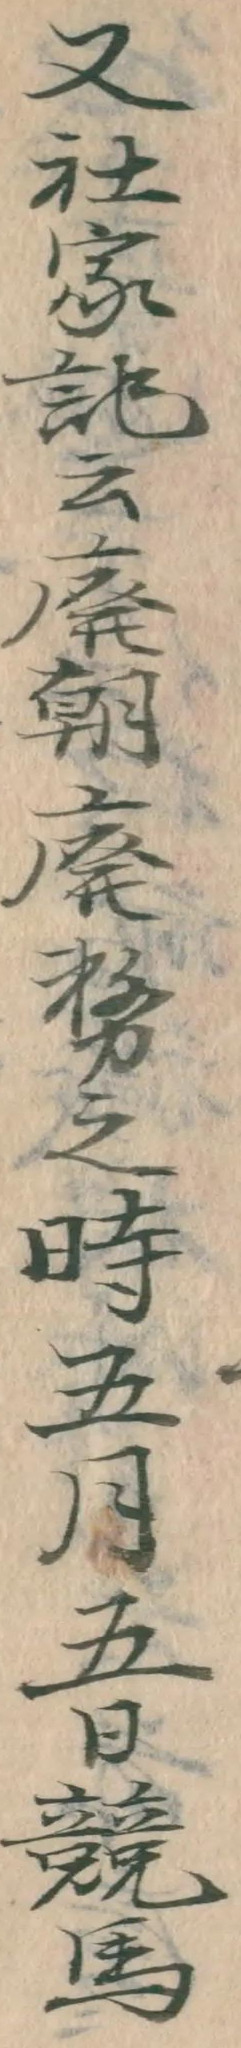又社家記云廃朝廃務之時五月五日競馬
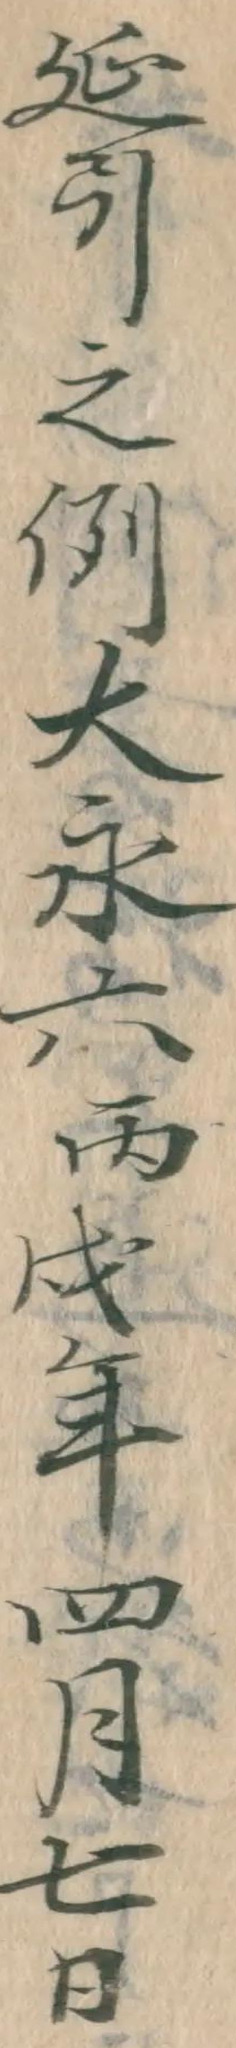延引之例大永六丙戌年四月七日
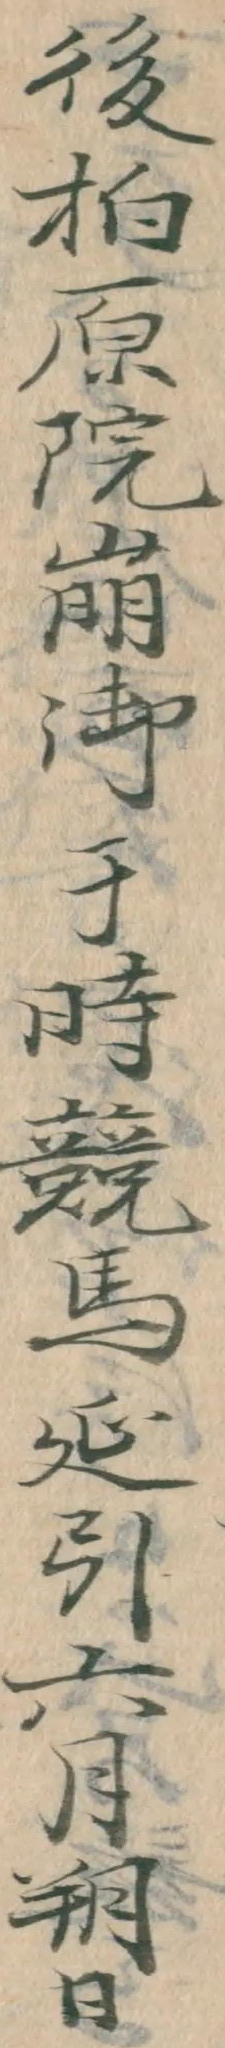後柏原院崩御于時競馬延引六月朔日
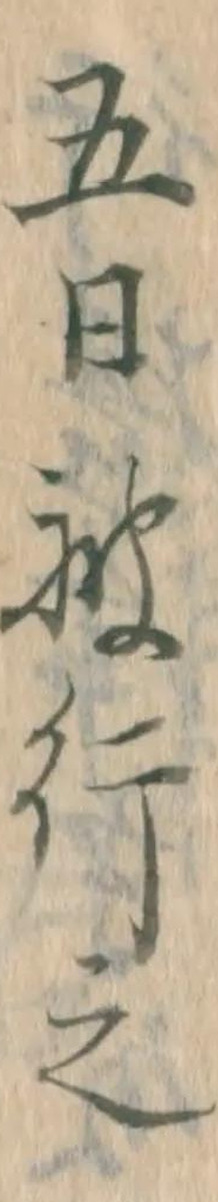五日被行之
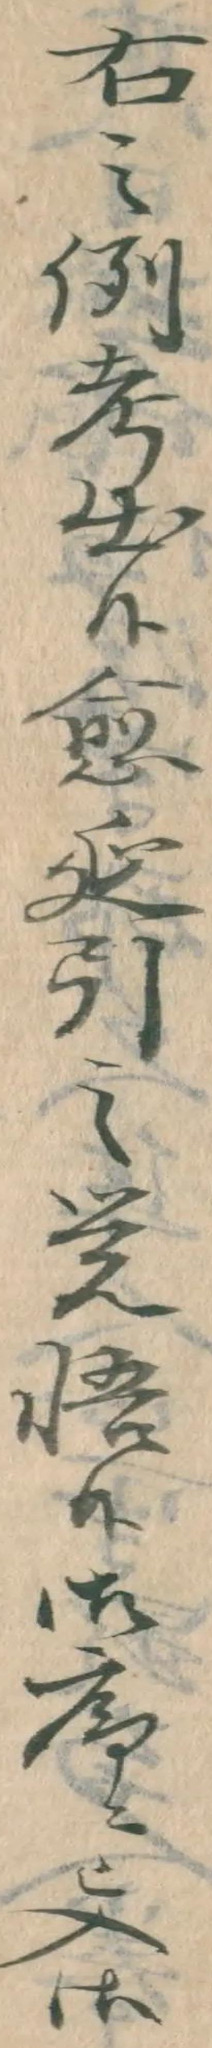右之例考出候愈延引之覚悟候御序ニ被入御
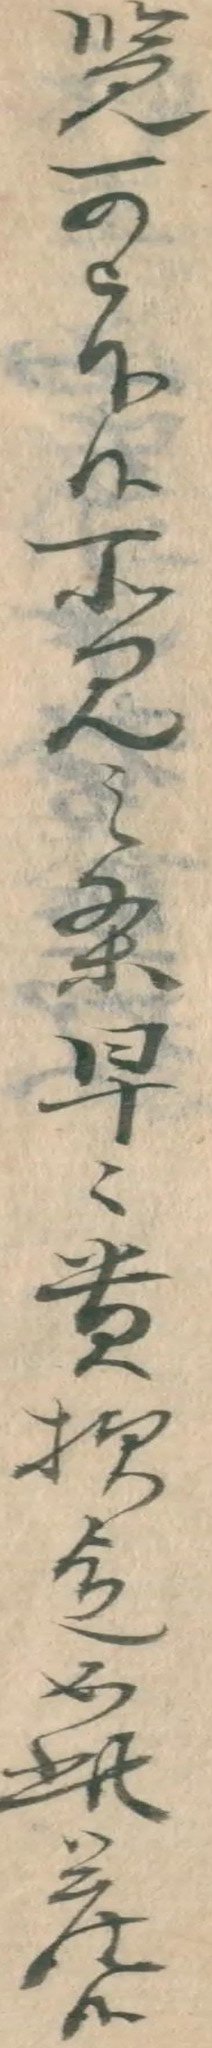覧可被下候所見之条早々貴様迄如此御座候
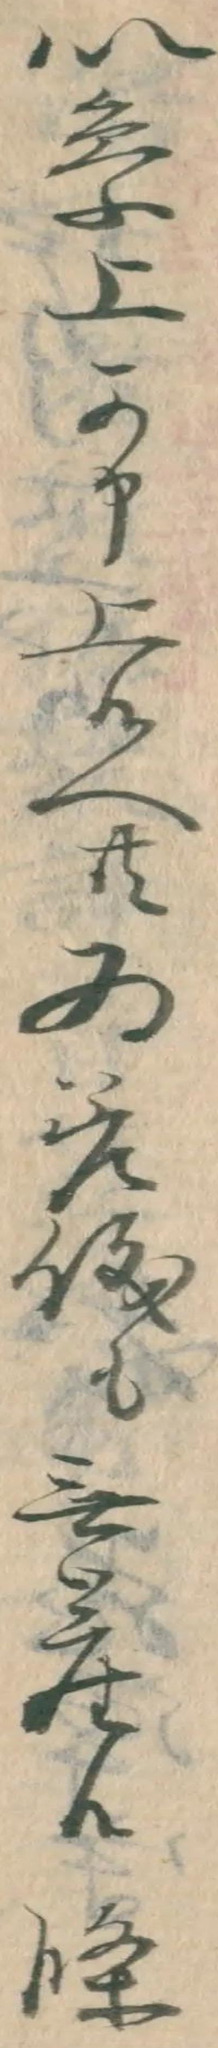以参上可申上候へ共為差儀も無御座候条
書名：賀茂社記録. 第10冊
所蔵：国立国会図書館 National Diet Library, JAPAN
